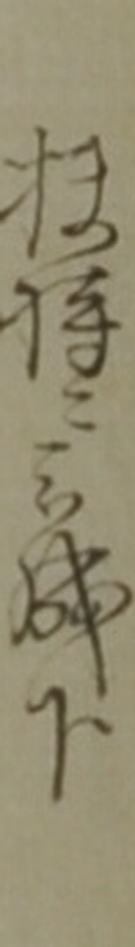扶持ニ被成下
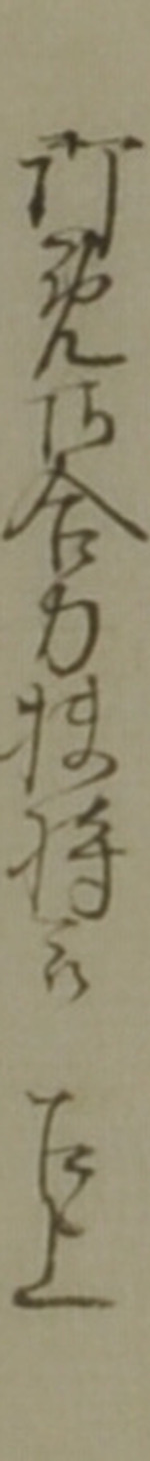御免御合力扶持被召上
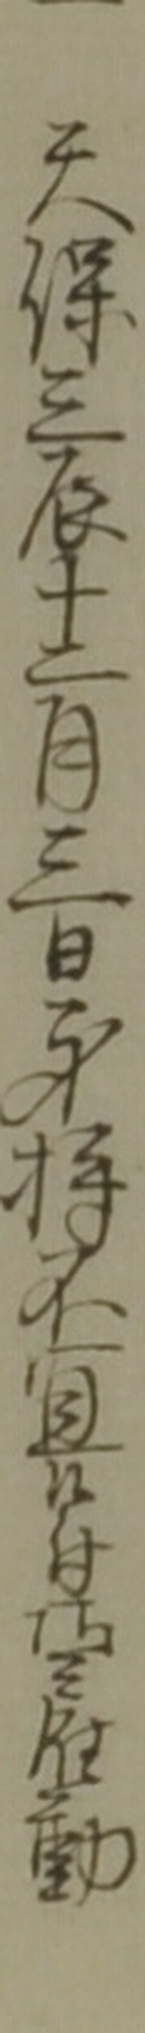一天保三辰十二月三日身持不宜付御雇勤
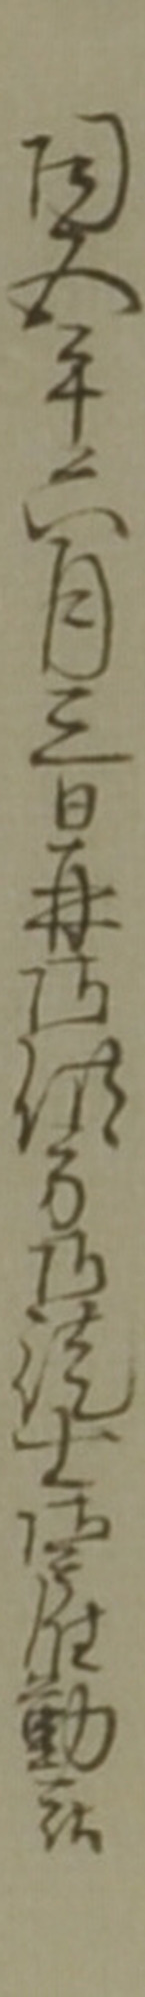一同五午六月三日再御供方御徒士御雇勤被
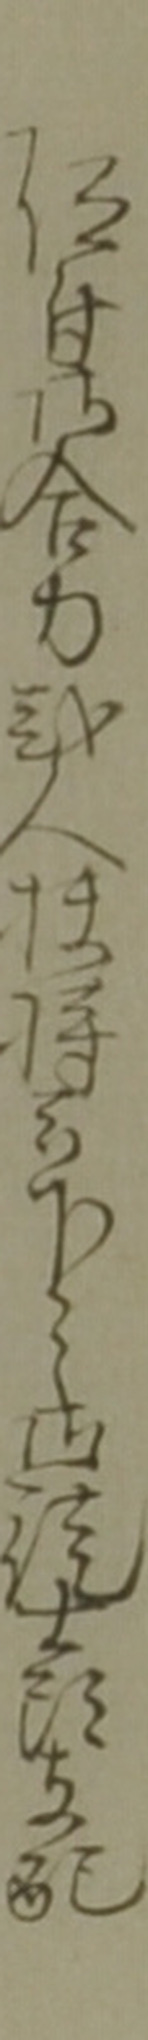仰付御合力弐人扶持被下之御徒士頭支配
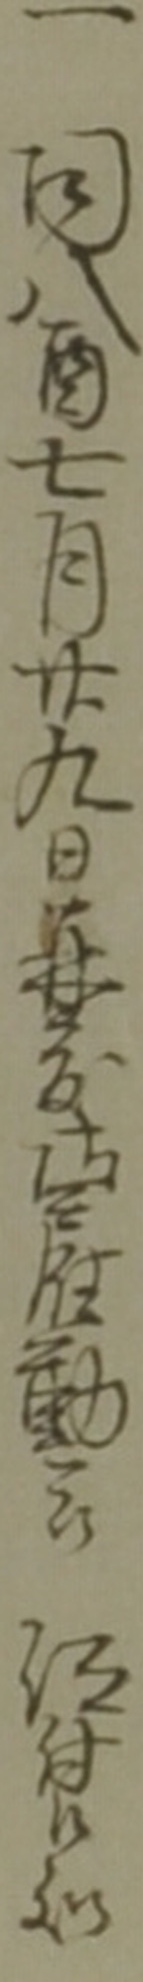一同八酉七月廿九日再官御雇勤被仰付候処
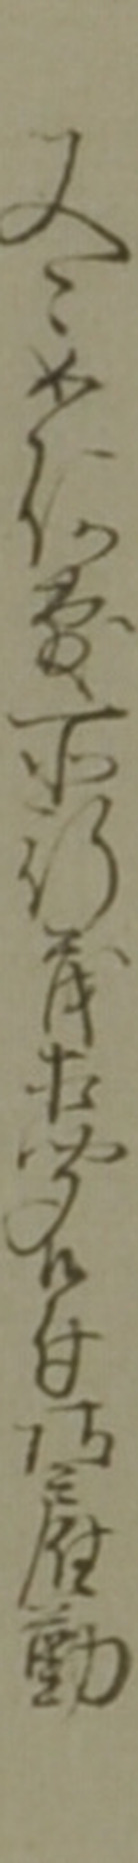又々如何敷所行茂相聞候付御雇勤
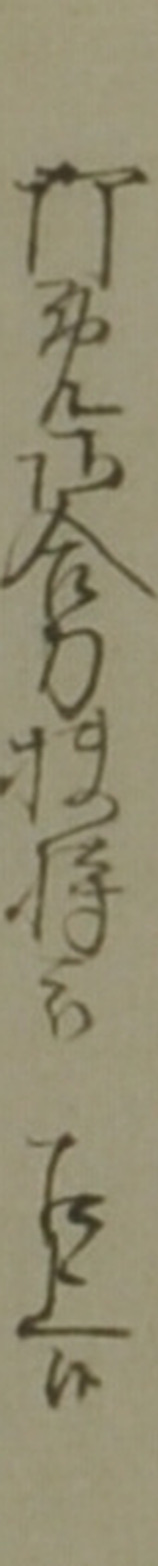御免御合力扶持被召上候
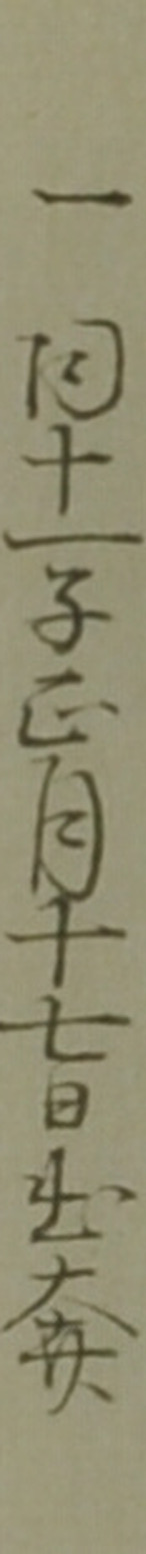一同十一子正月十七日出奔

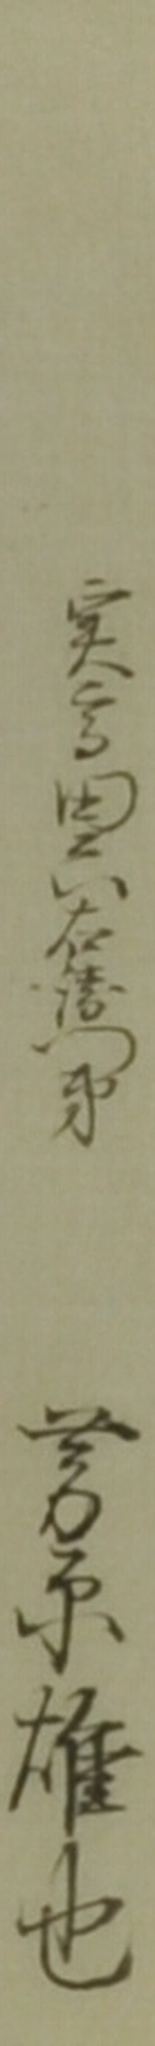実高田六右衛門弟芳原雄也
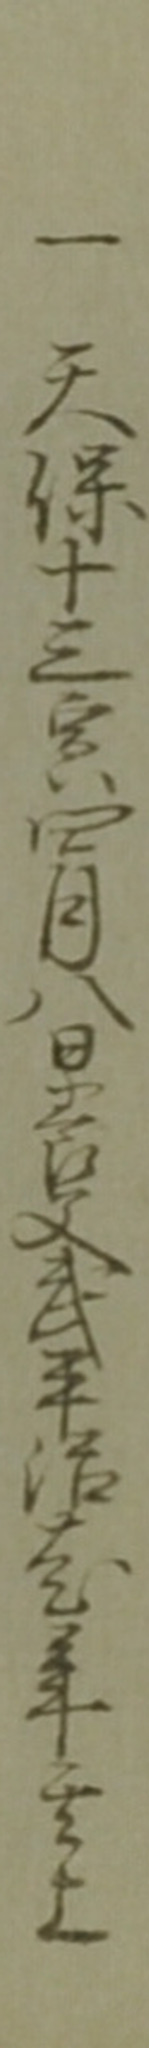一天保十三寅四月八日養父武平治老年其上
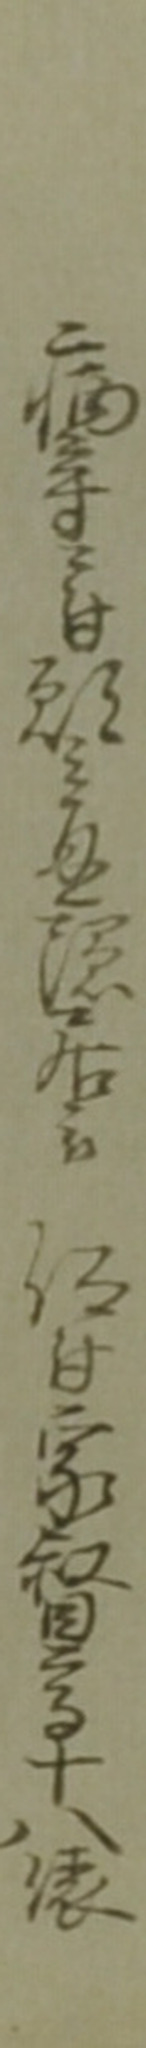病気ニ付願之通隠居被仰付家督高十八俵
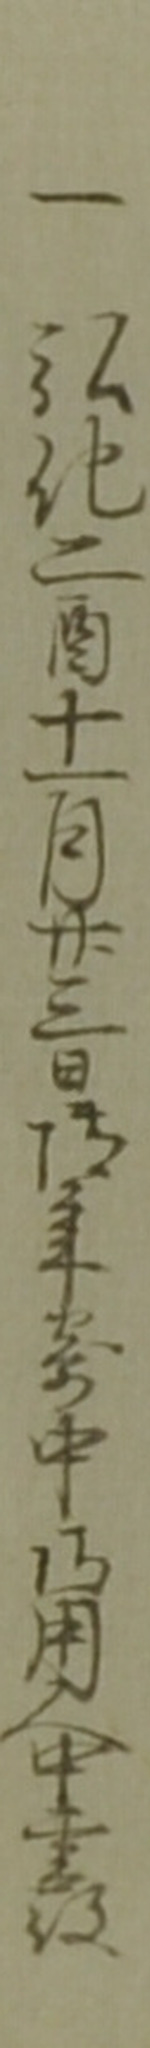一弘化二酉十一月廿三日御年寄中御用人中書役

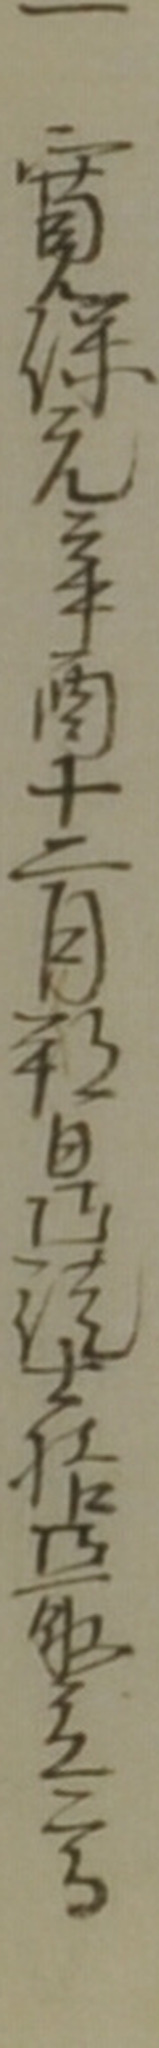一寛保元年酉十二月朔日御徒士格御取立高
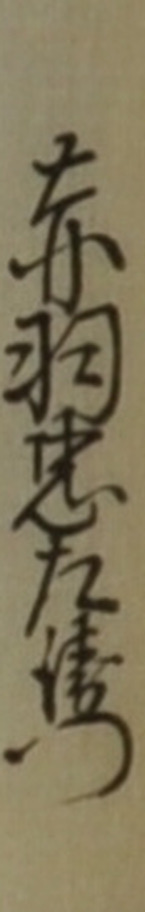赤羽忠左衛門
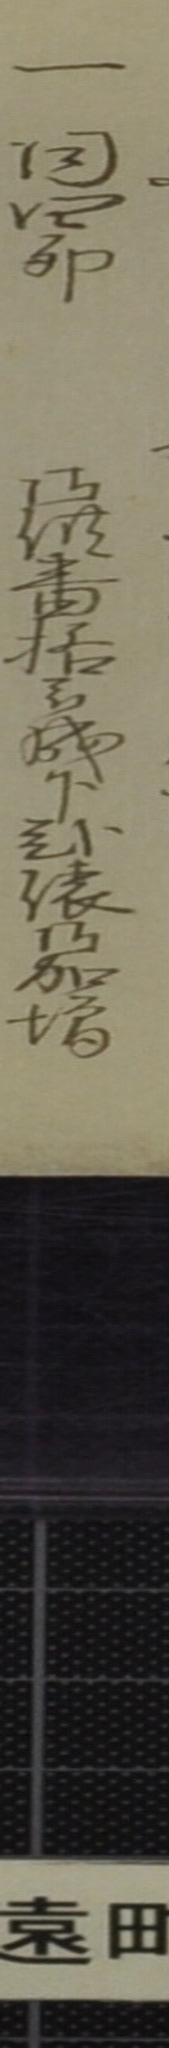一同四卯御供番格被成下弐俵御加増
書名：無足諸士勤仕録（五）
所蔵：伊那市立高遠町図書館・合同会社AMANE
